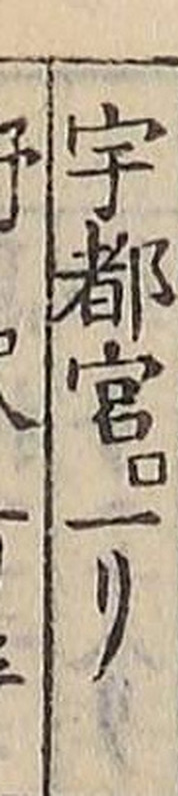宇都宮▫一リ
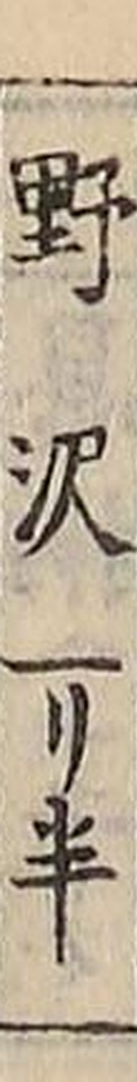野沢一リ半
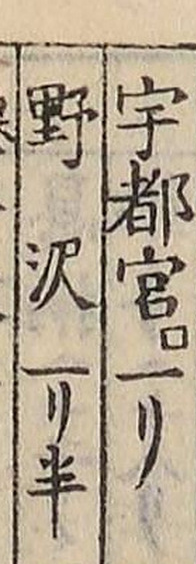宇都宮▫一リ
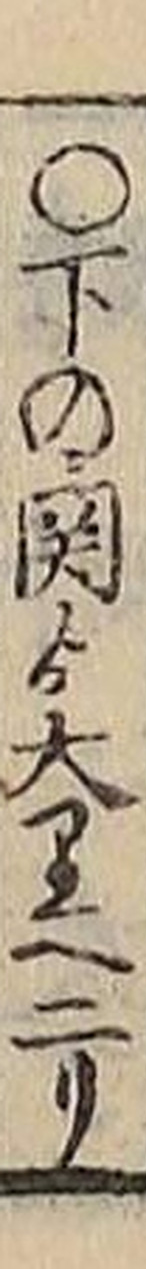○下の関ゟ大里へ二リ
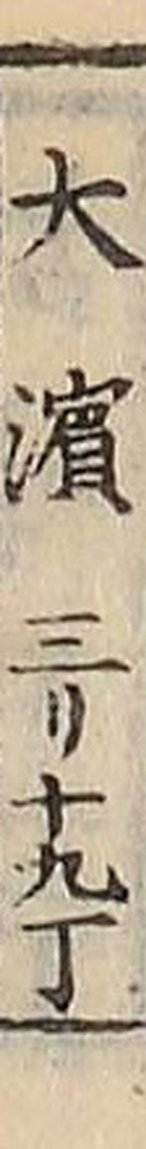大浜三リ十九丁
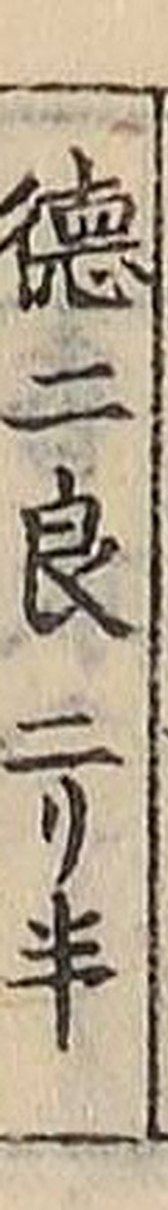徳二良二リ半
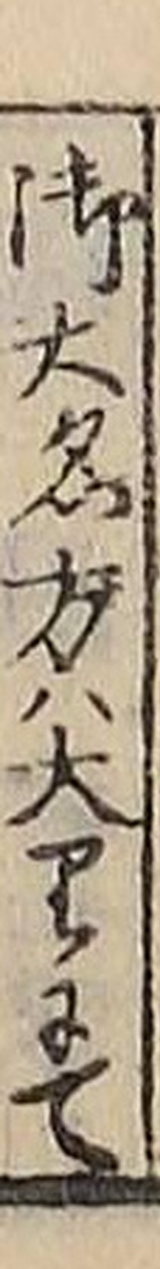御大名方は大里にて
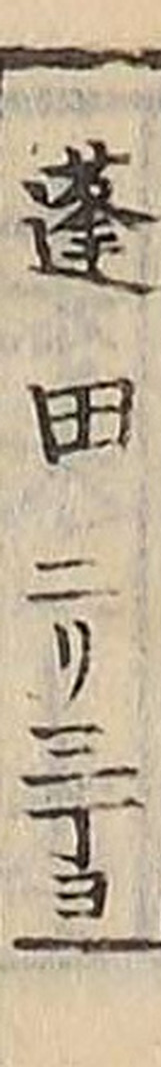蓬田二リ三丁ヨ
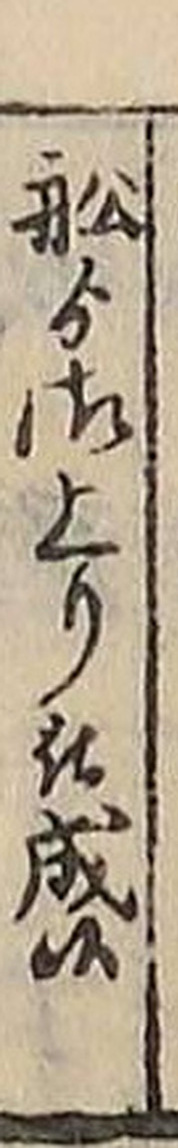船ゟ御上り被成候
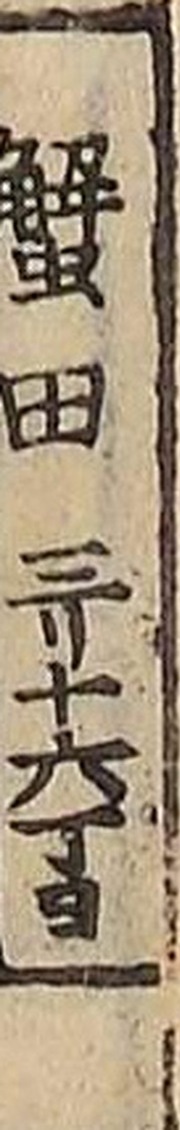蟹田三リ十六丁ヨ
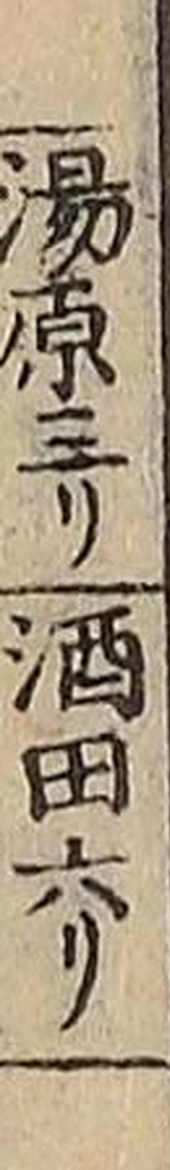湯原三リ酒田六リ
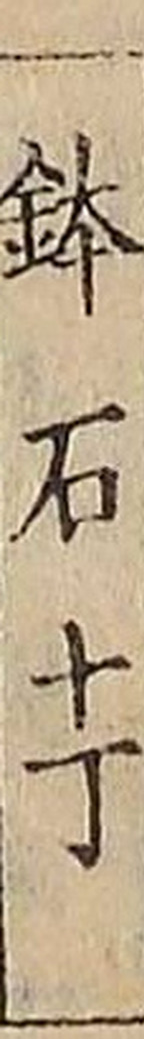鉢石十丁
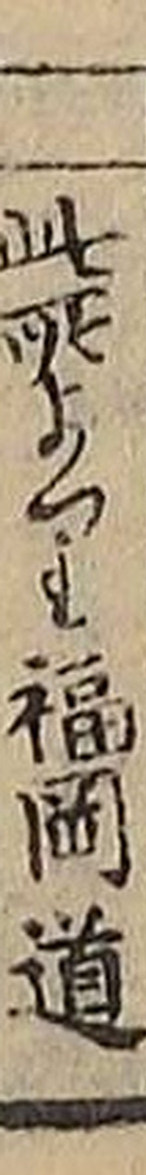此所より福岡道
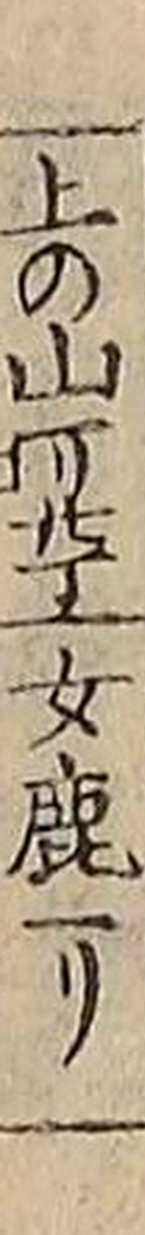上の山一リ廿丁女鹿一リ
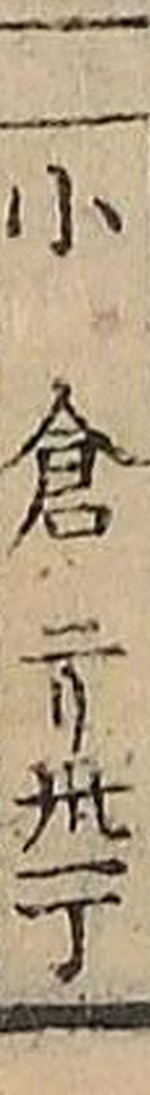小倉▫二リ卅一丁
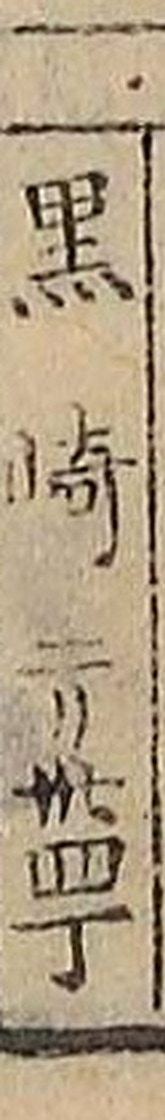黒崎二リ卅四丁
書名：旅行用心集
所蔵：神戸大学附属図書館 国文学研究資料館
